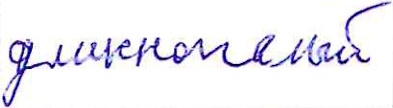длиннопалый
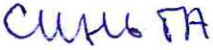синьга
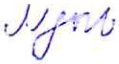лунь
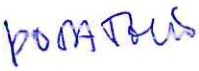рогатый
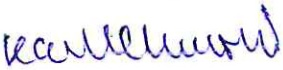каменный
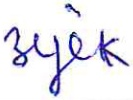зуёк
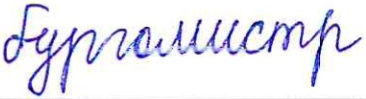бургомистр
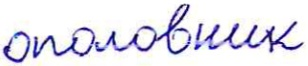ополовник
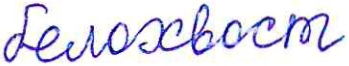белохвост
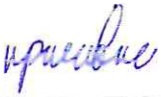крисивке
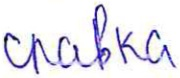славка
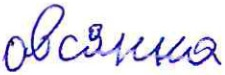овсянка
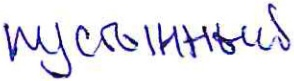пустынный
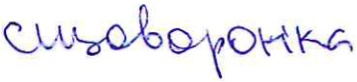сизоворонка
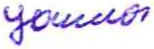уапла
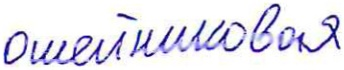ошейниковая
